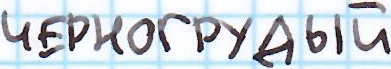черногрудый
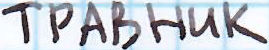травник
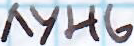лунь
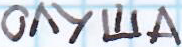олуша
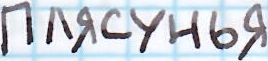плясунья
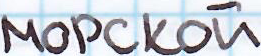морской
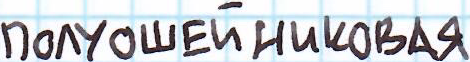полуошейниковая
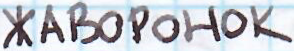жаворонок
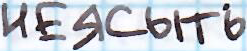неясыть
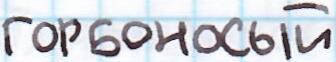горбоносый
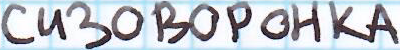сизоворонка
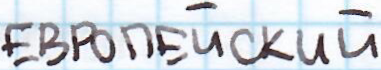европейский
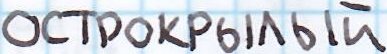острокрылый
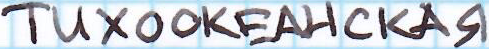тихоокеанская
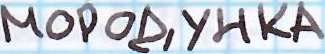мородунка
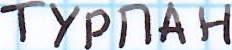турпан
